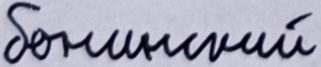бонинский
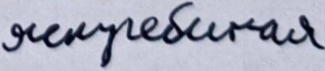ястребиная
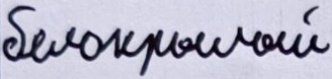белокрылый
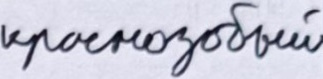краснозобый
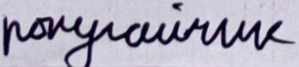попугайчик
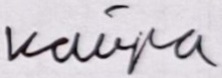кайра
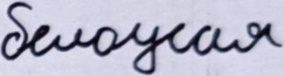белоусая
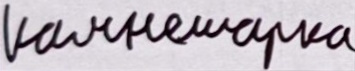камнешарка
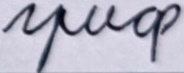гриф
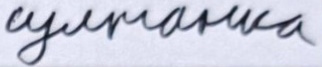султанка
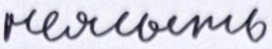неясыть
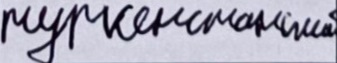туркенстанский
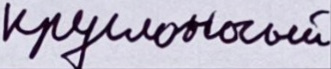круглоносый
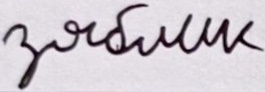зяблик
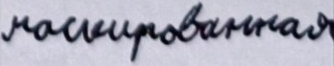маскированная
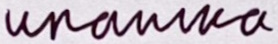ипатка
